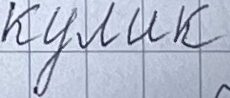кулик
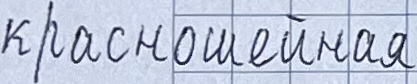красношейная
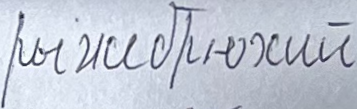рыжебрюхий
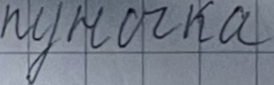пуночка
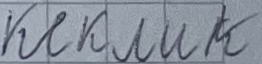кеклик
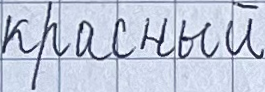красный
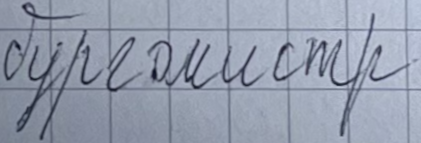бургомистр
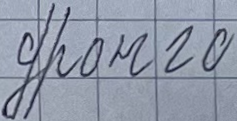дронго
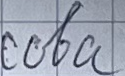сова
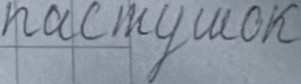пастушок
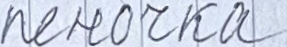пеночка
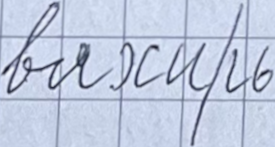вяхирь
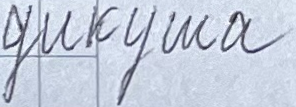дикуша
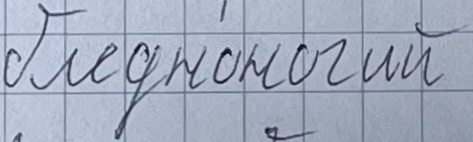бледноногий
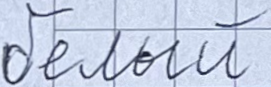белый
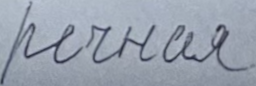речная
